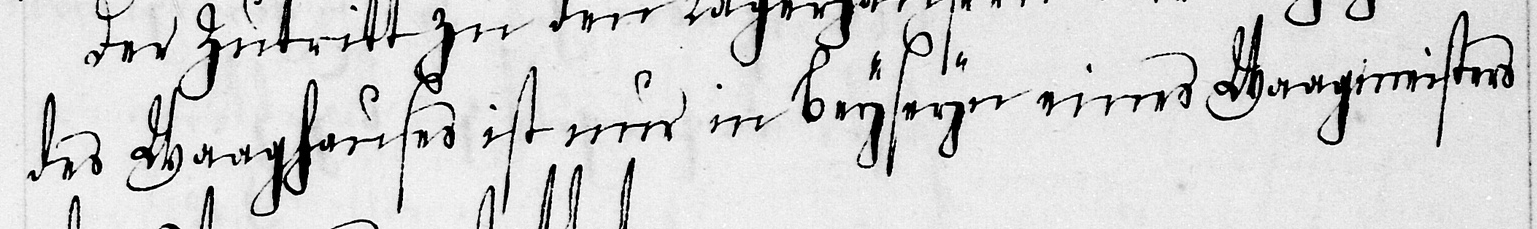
des Waaghauses ist nur in Beyseyn eines Waagmeisters
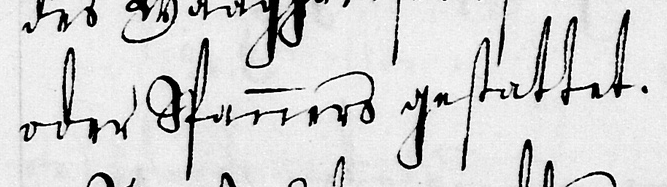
oder Spanners gestattet.
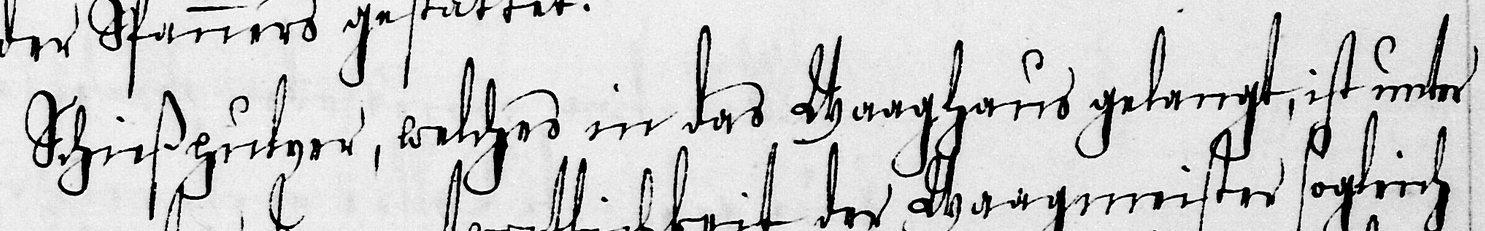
Schießpulver, welches in das Waaghaus gelangt, ist unt¬
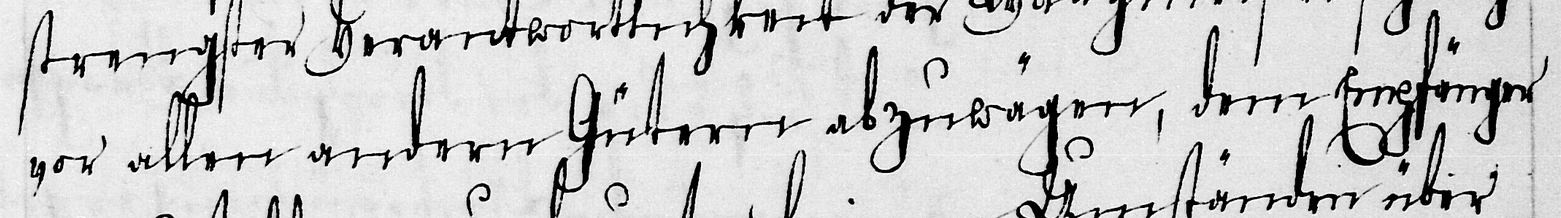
vor allen andern Gütern abzuwägen, dem Empfänger
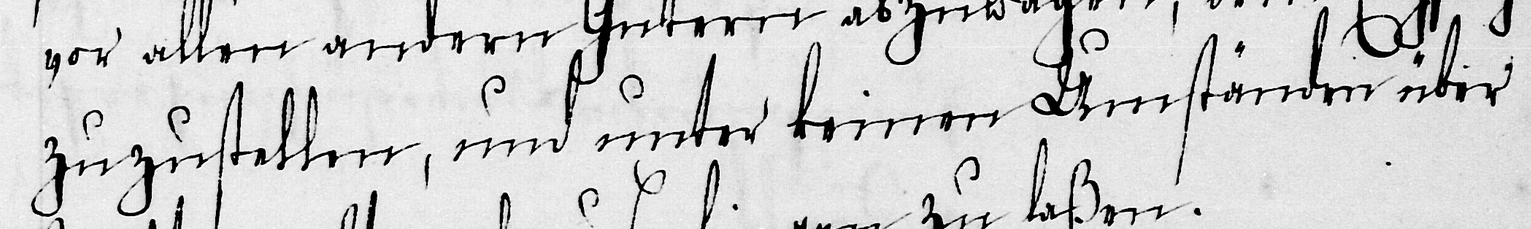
zuzustellen, und unter keinen Umständen über
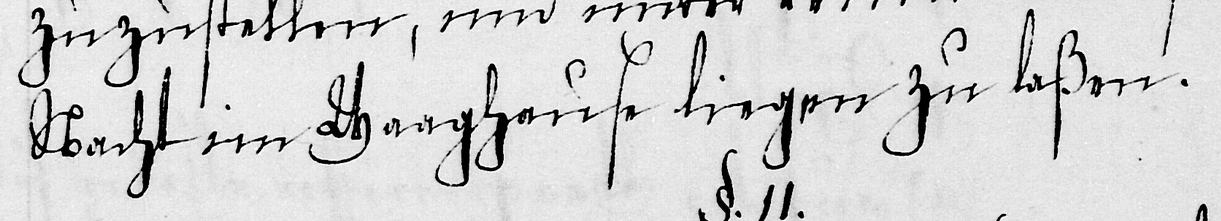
Nacht im Waaghause liegen zu laßen.
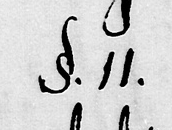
§. 11.
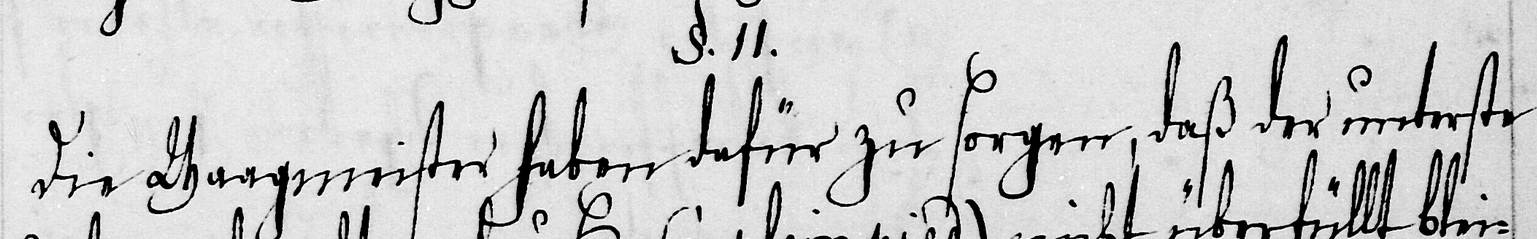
Die Waagmeister haben dafür zu sorgen, daß der unterste
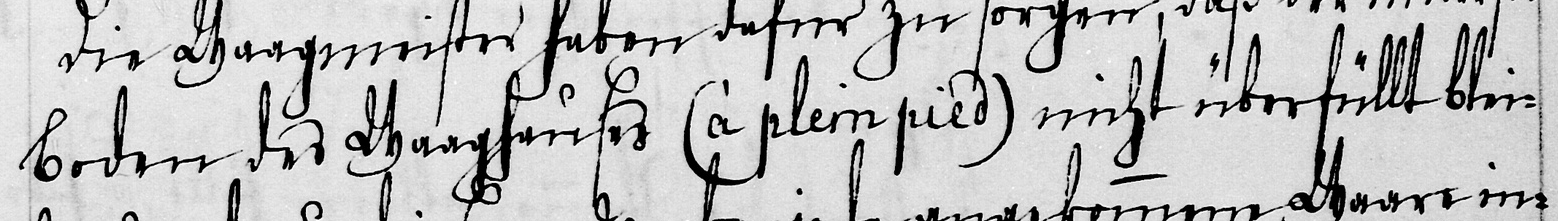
Boden des Waaghauses (à plein pied) nicht überfüllt ble¬
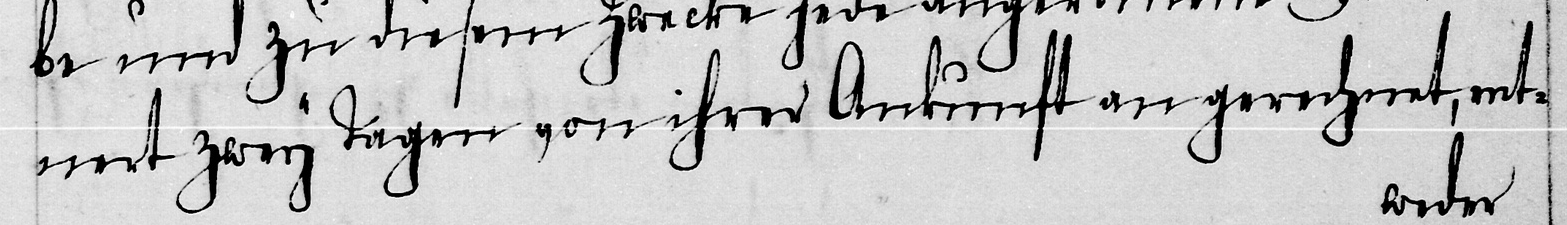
nert zwey Tagen von ihrer Ankunft an gerechnet, ent-
